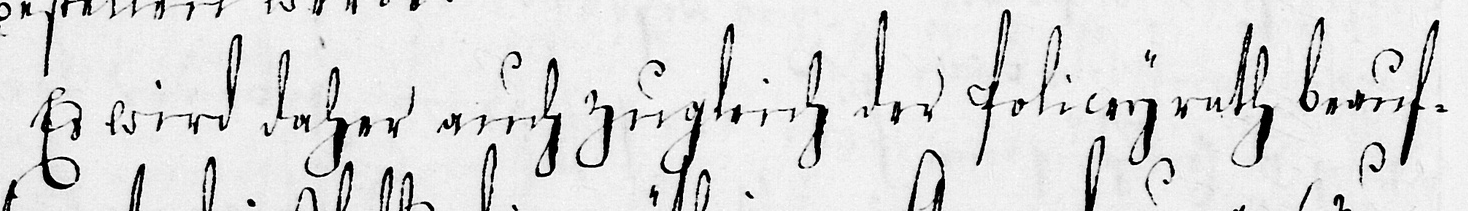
Es wird daher auch zugleich der Policeyrath beauf¬
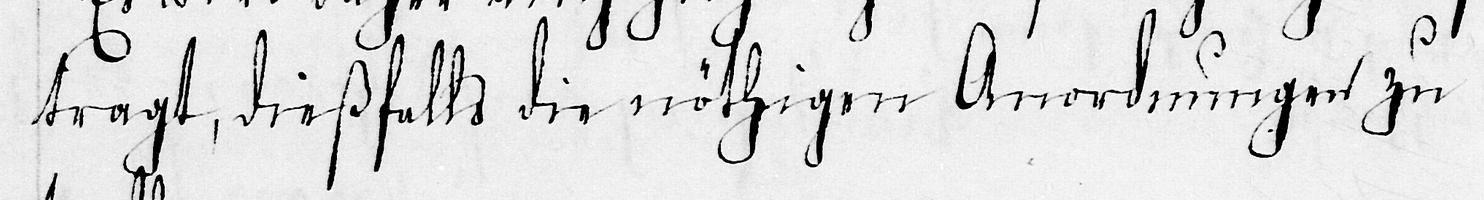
tragt, dießfalls die nöthigen Anordnungen zu
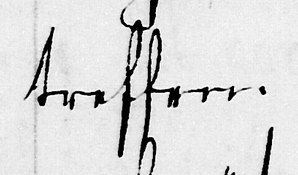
treffen.
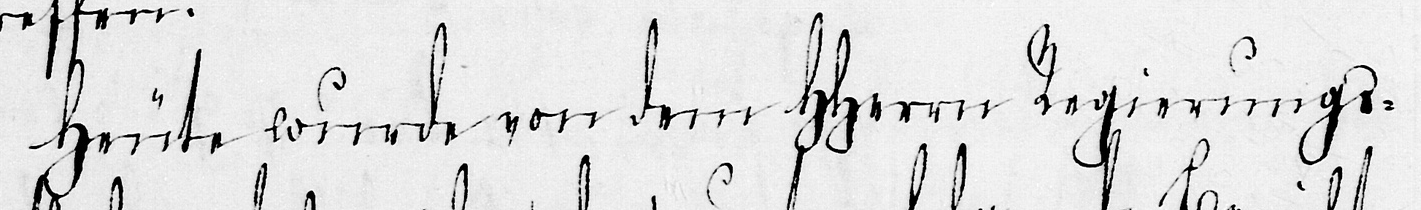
Heute wurde von dem HHerrn Regierungs¬
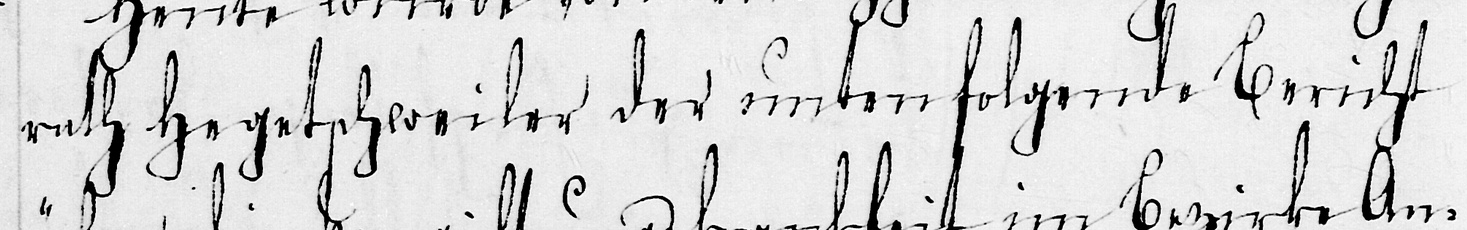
rath Hegetschweiler der unten folgende Bericht
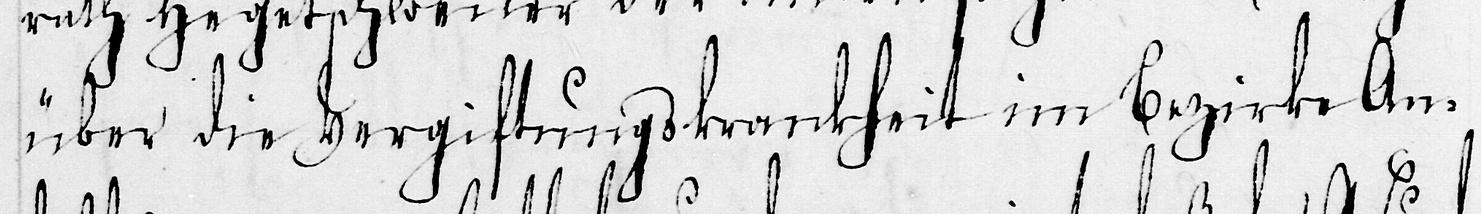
über die Vergiftungskrankheit im Bezirke An¬
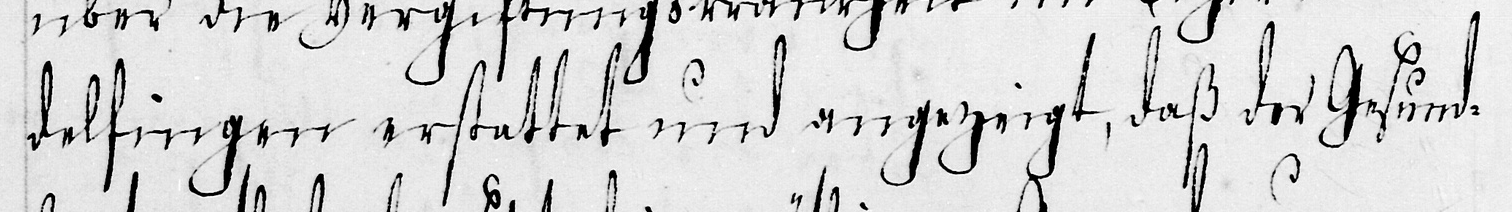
delfingen erstattet und angezeigt, daß der Gesund¬
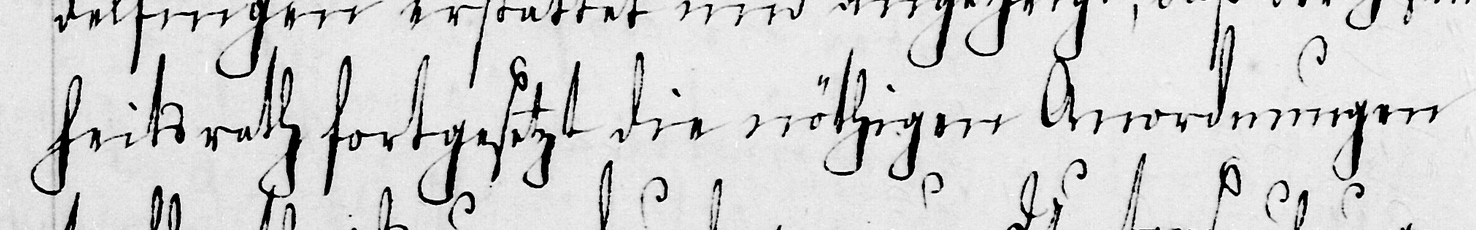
heitsrath fortgesetzt die nöthigen Anordnungen
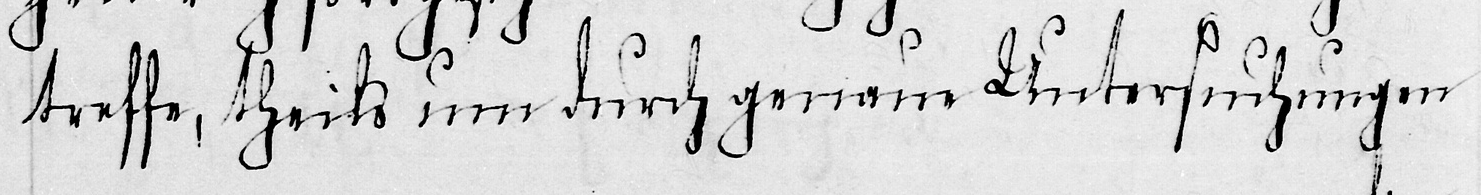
treffe, theils um durch genaue Untersuchungen
